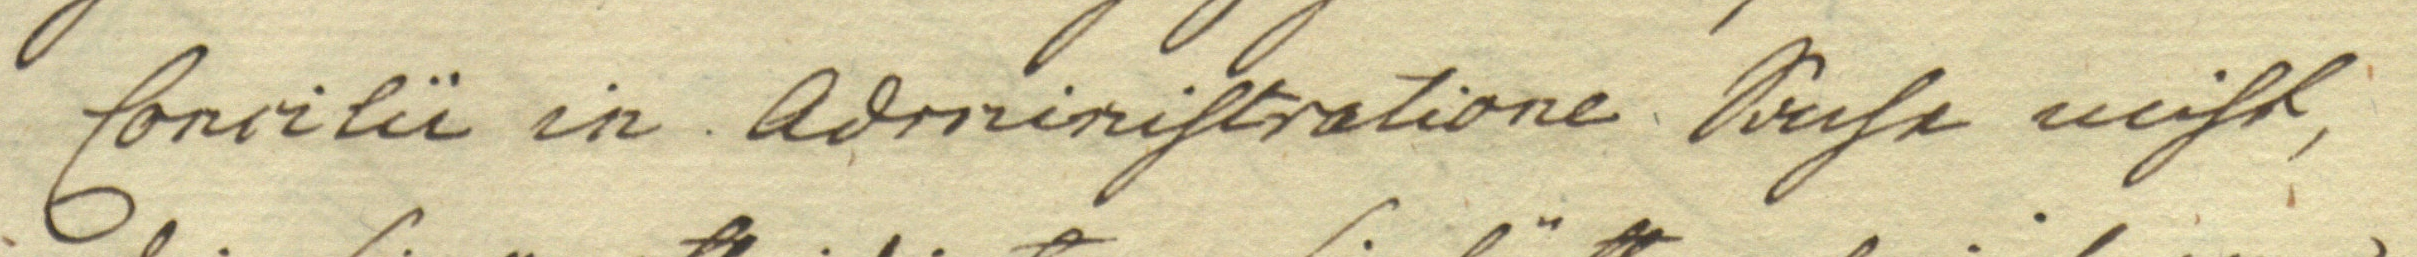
Concilii in Administratione Sache nicht,
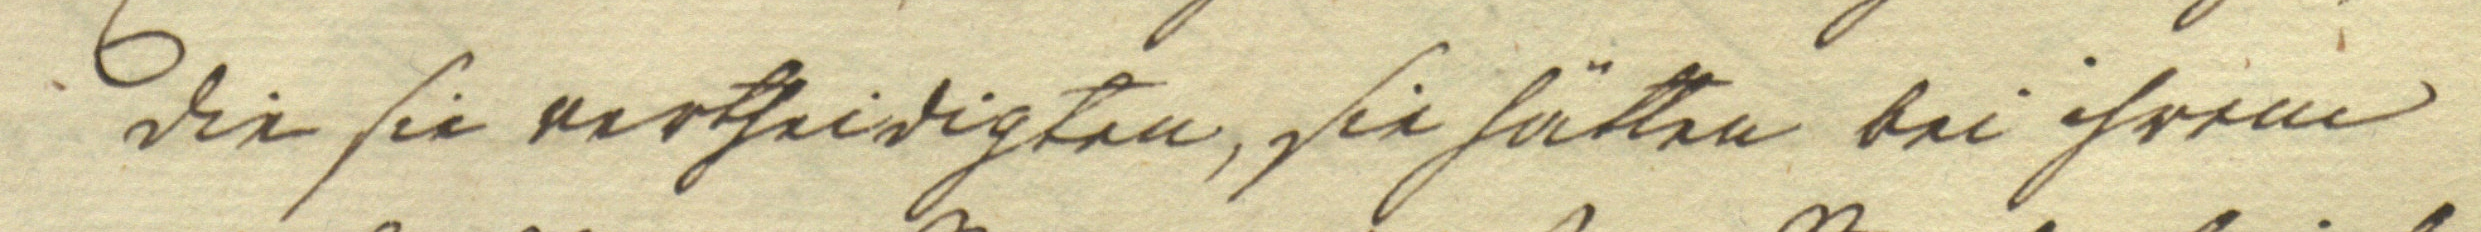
die sie vertheidigten, sie hätten bei ihrem
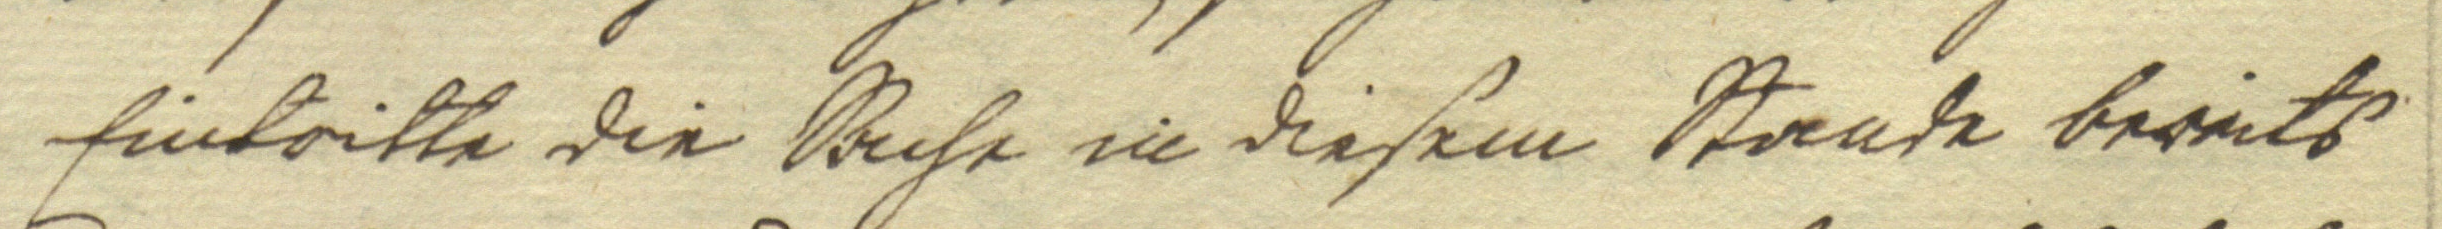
Eintritte die Sache in diesem Stande bereits
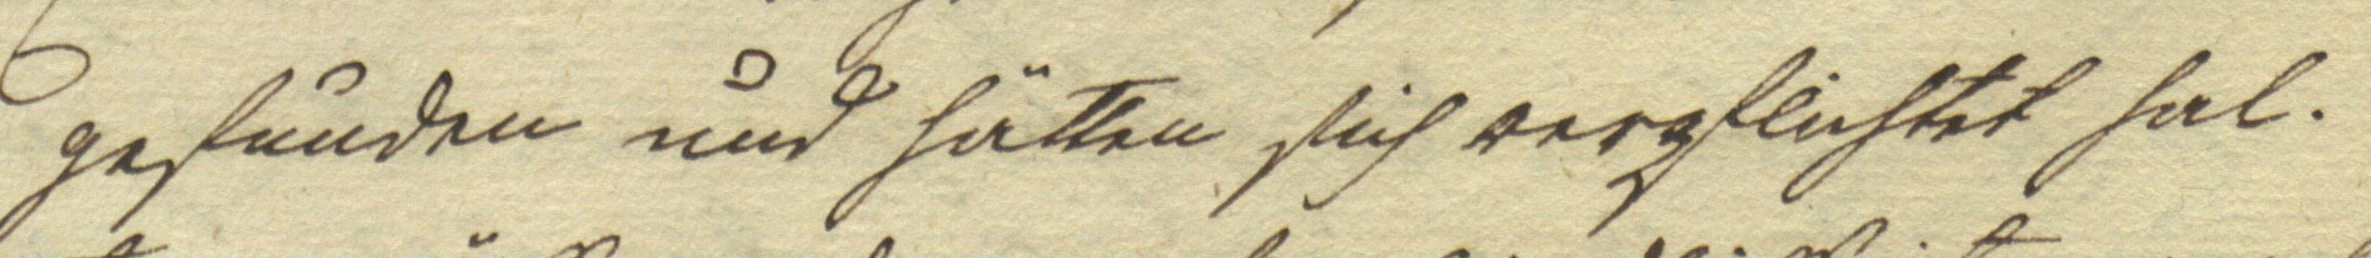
gefunden und hätten sich verpflichtet hal¬
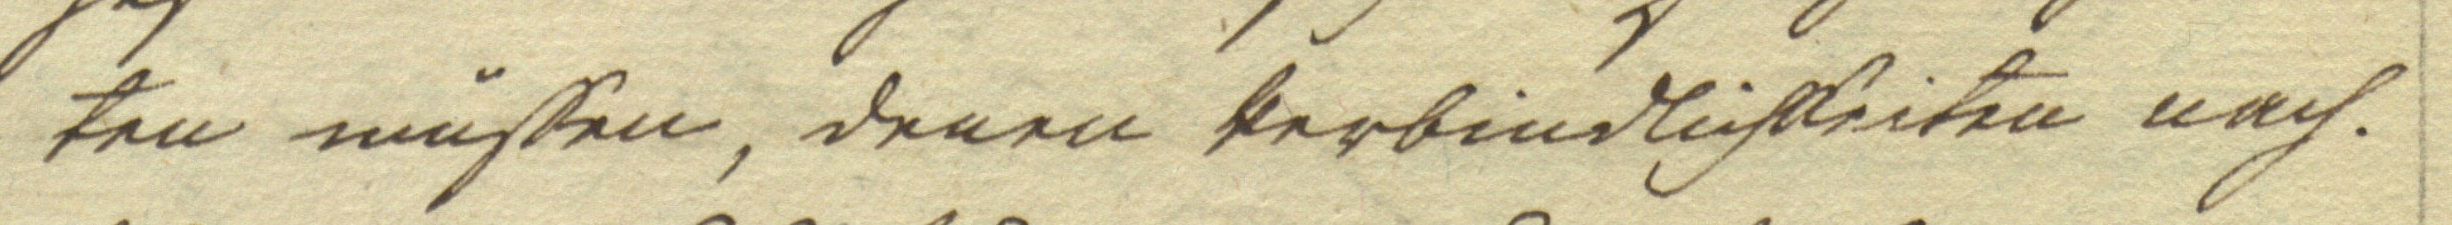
ten müssen, denen Verbindlichkeiten nach¬
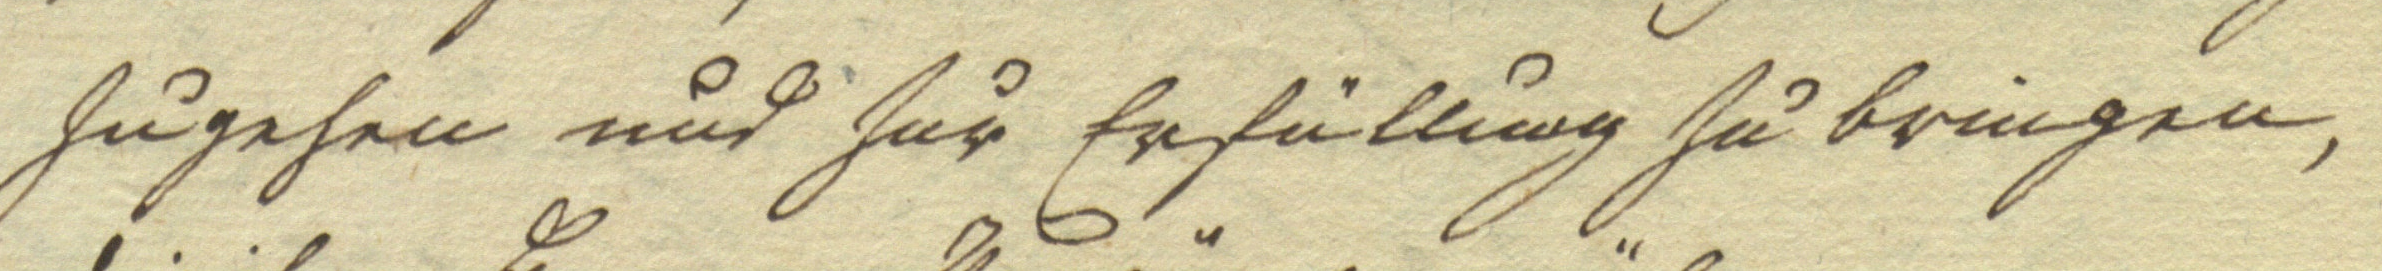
zugehen und zur Erfüllung zu bringen,
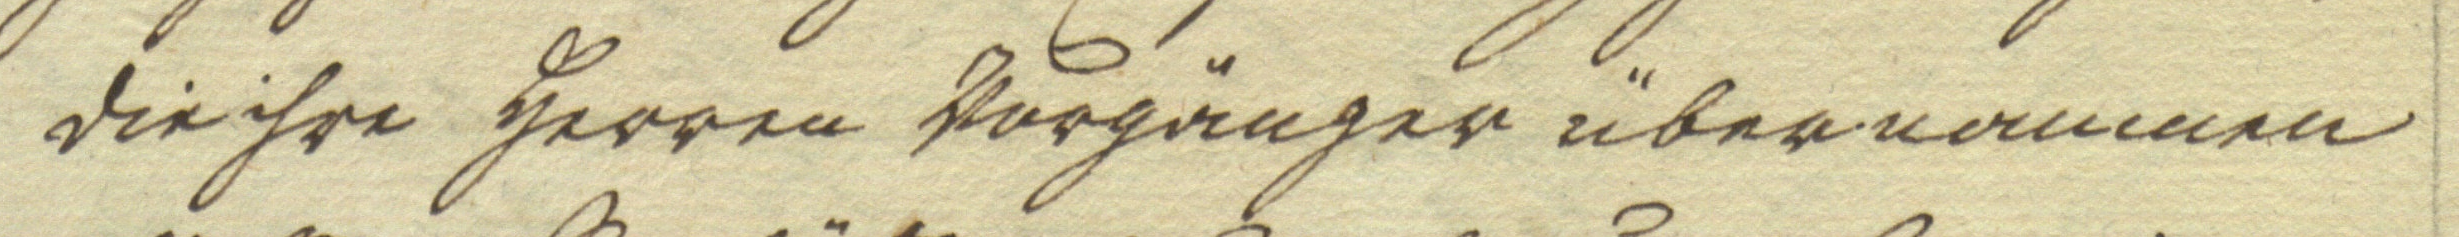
die ihre Herren Vorgänger übernommen
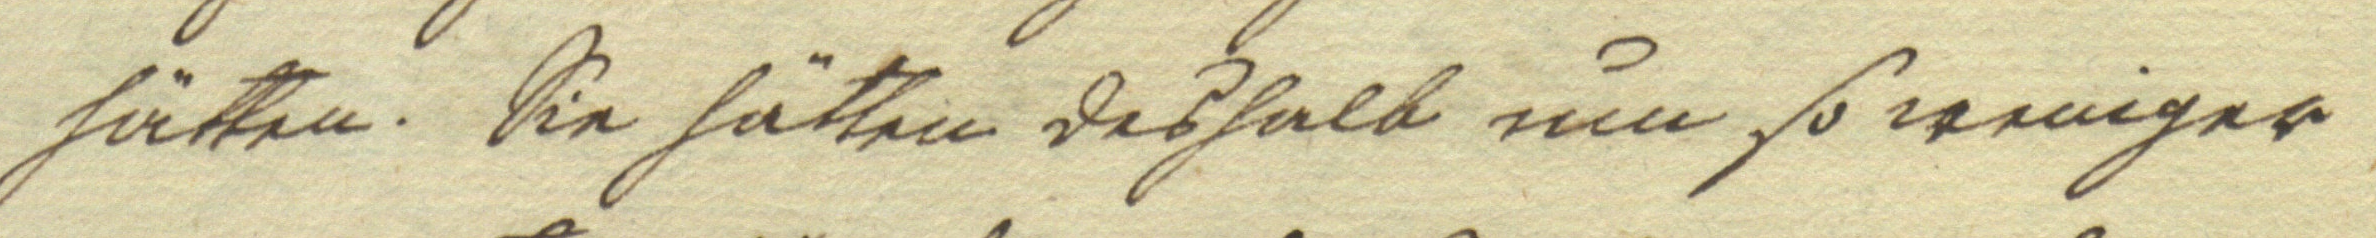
hätten. Sie hätten deshalb um so weniger
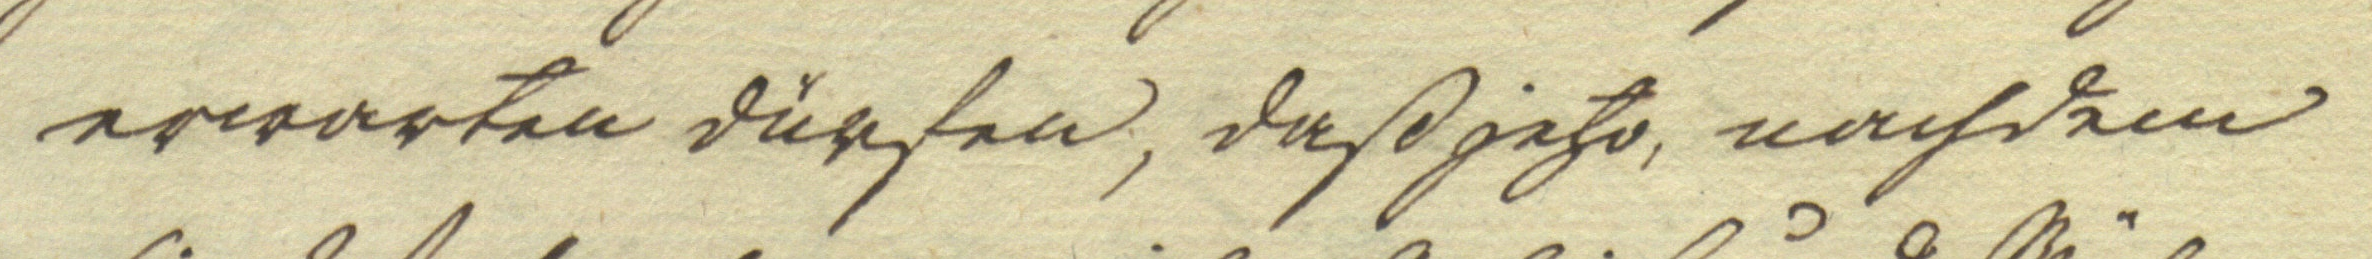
erwarten dürfen, daß jetzo, nachdem
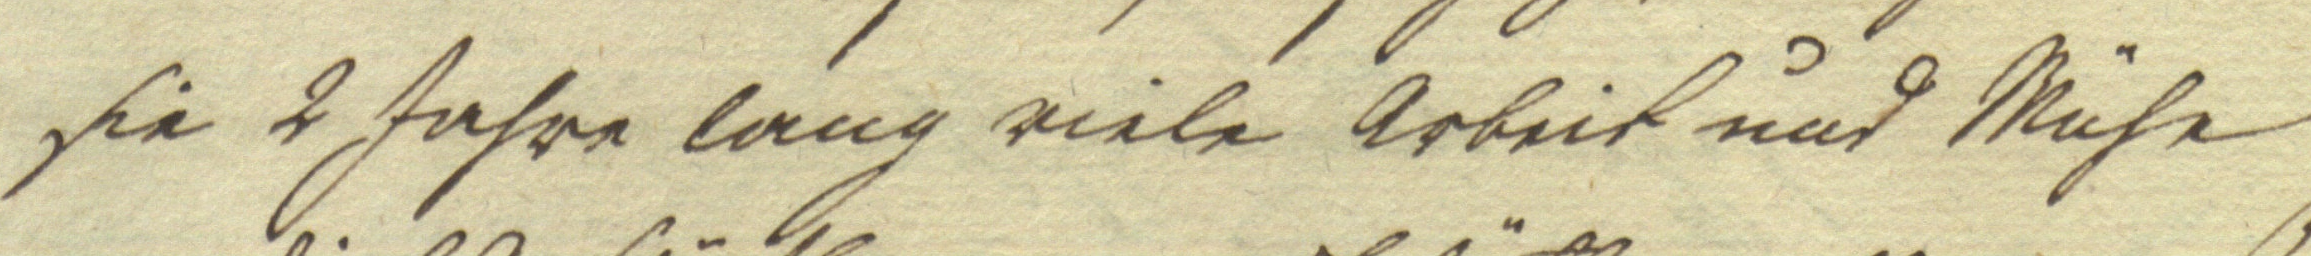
sie 2 Jahre lang viele Arbeit und Mühe
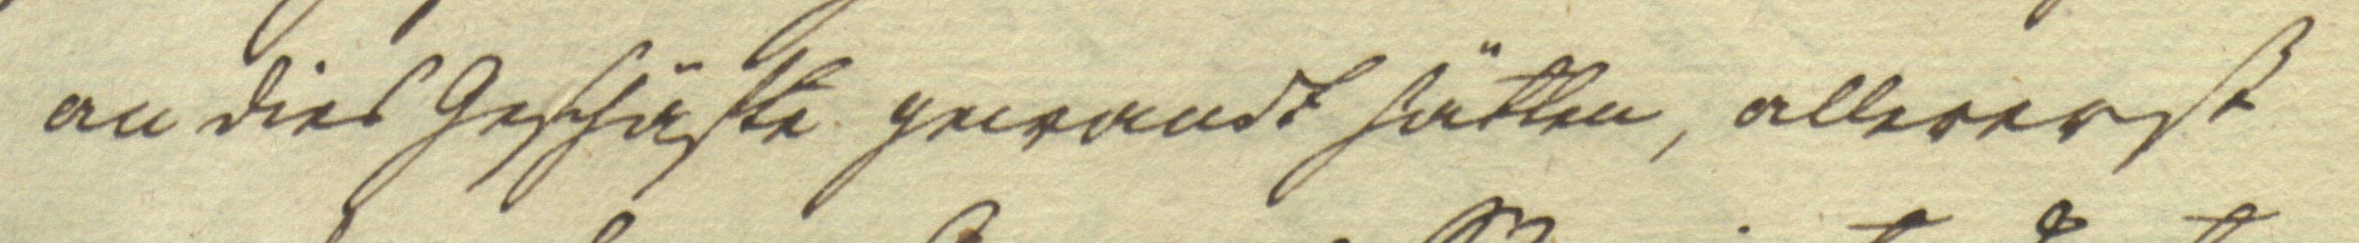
an dies Geschäfte gewandt hätten, allererst
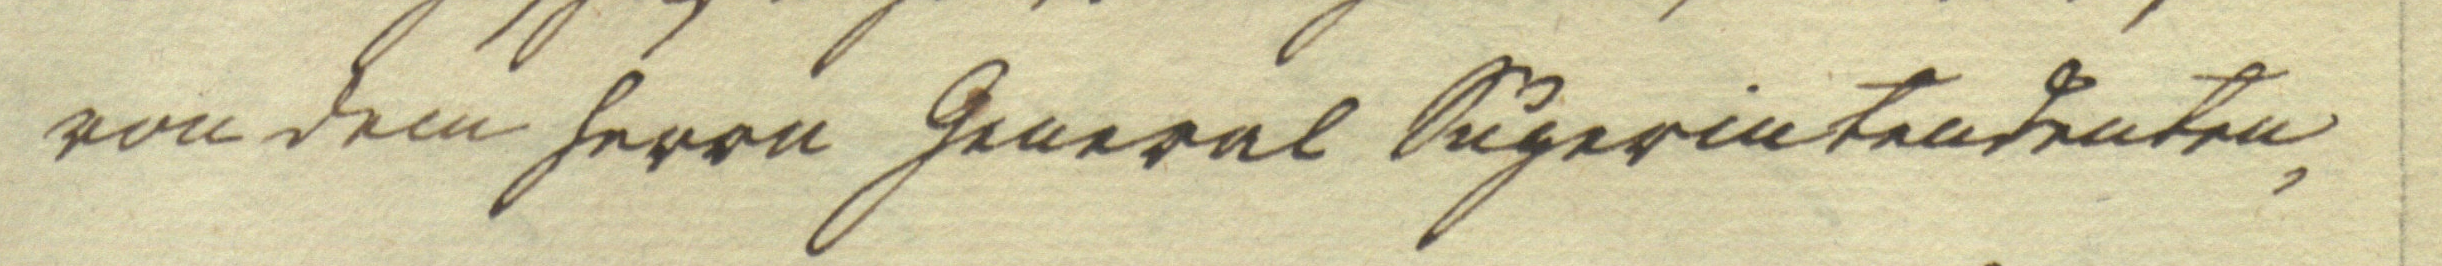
von dem Herrn General Superintendenten,
